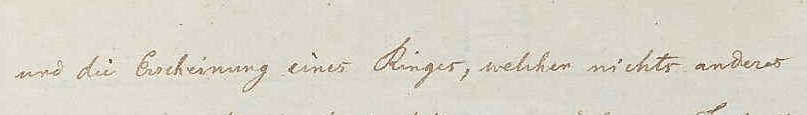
und die Erscheinung eines Ringes, welcher nichts anderes
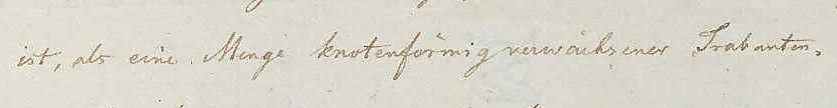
ist, als eine Menge knotenförmig verwachsener Trabanten.
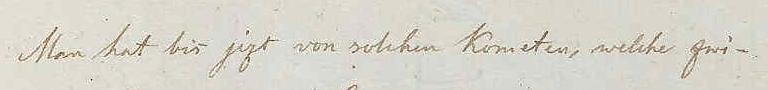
Man hat bis jezt von solchen Kometen, welche zwi-
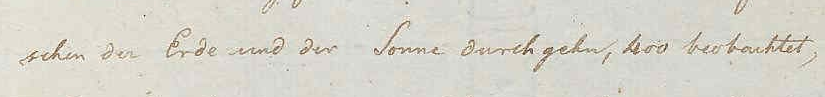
schen der Erde und der Sonne durchgehn, 400 beobachtet,
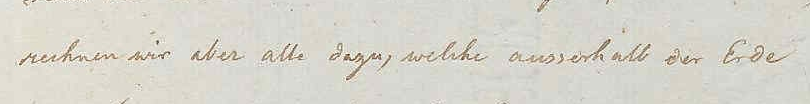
rechnen wir aber alle dazu, welche ausserhalb der Erde
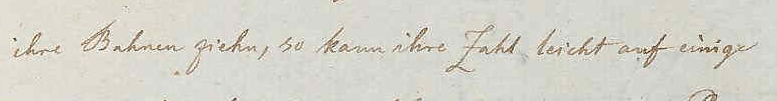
ihre Bahnen ziehn, so kann ihre Zahl leicht auf einige
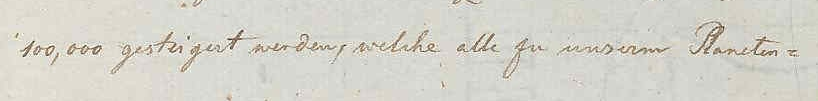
100,000 gesteigert werden, welche alle zu unserm Planeten-
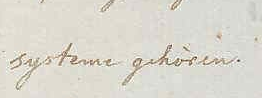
systeme gehören.
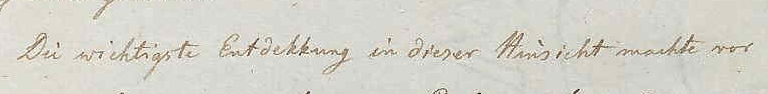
Die wichtigste Entdekkung in dieser Hinsicht machte vor
